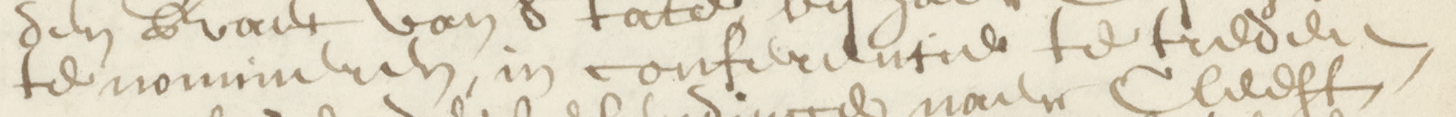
te nomineren, in conferentie te treden,
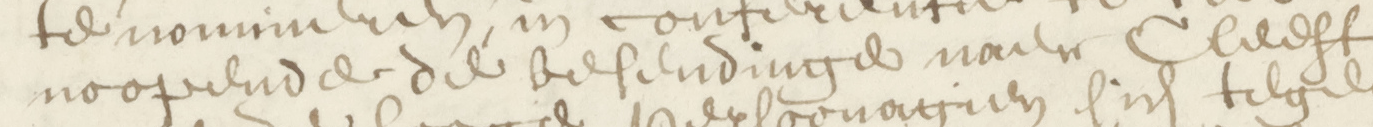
noopende de besendinge naer Cleeff
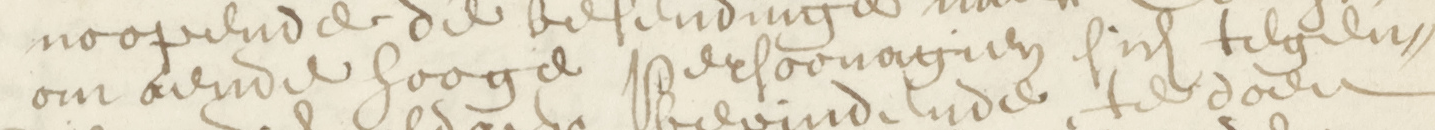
om aende hooge persoonagien sich tegen„
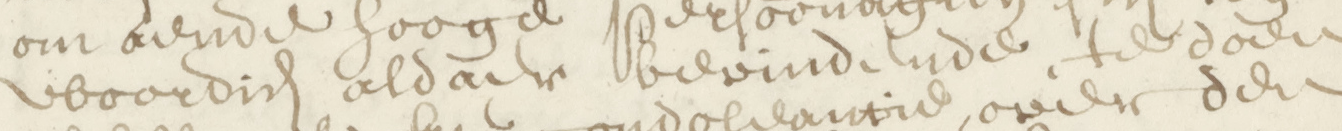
woordich aldaer bevindende, te doen
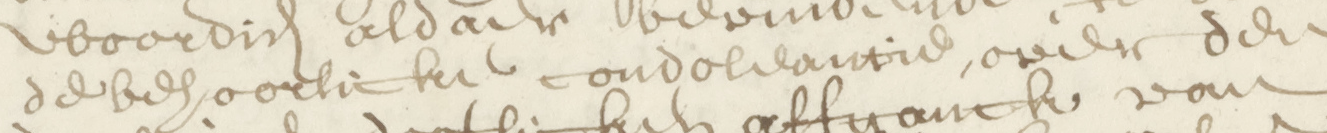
de behoorlicke condoleantie, over den
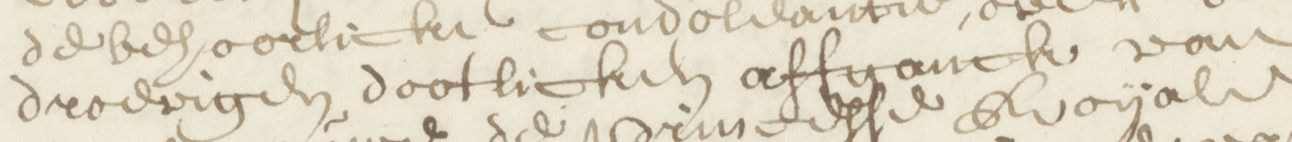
droevigen dootlicken affganck van
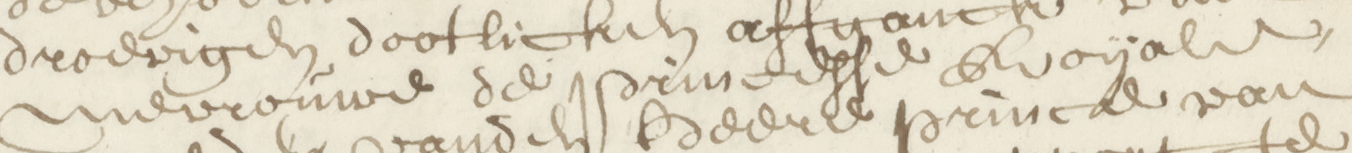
mevrouwe de Princesse Roijale,
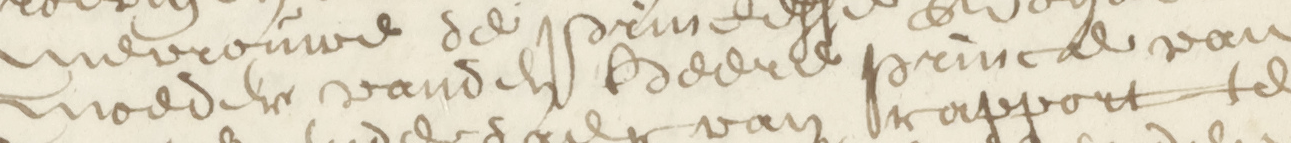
moeder vanden Heere prince van
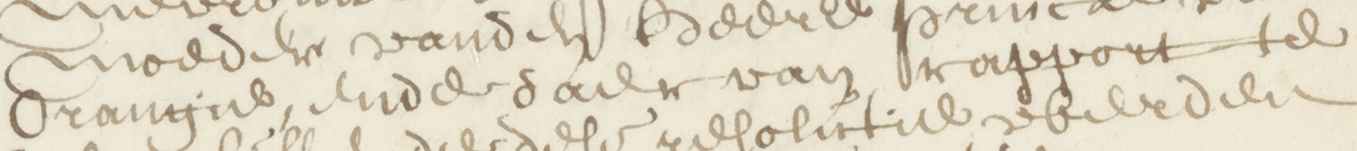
Orangne ende daer van rapport te
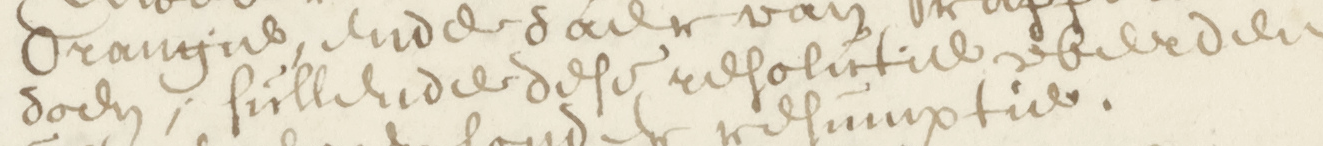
doen; sullende dese resolutie werden
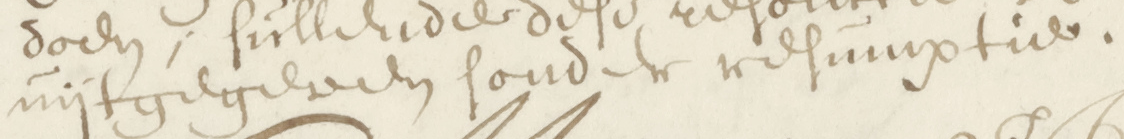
uijtgegeven sonder resumptie.
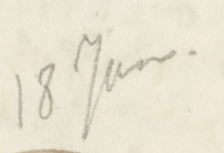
18 Jan.
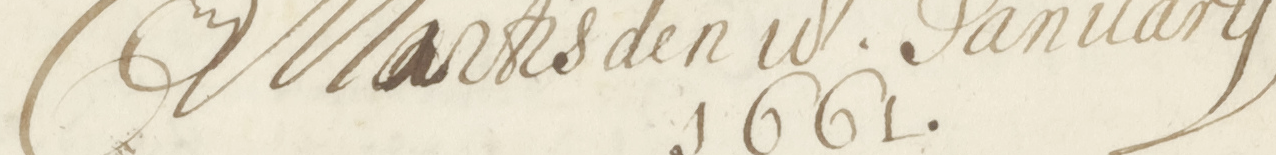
Martis den 18en Januarij
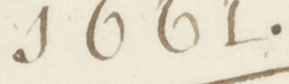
1661.
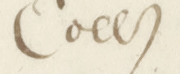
Coll
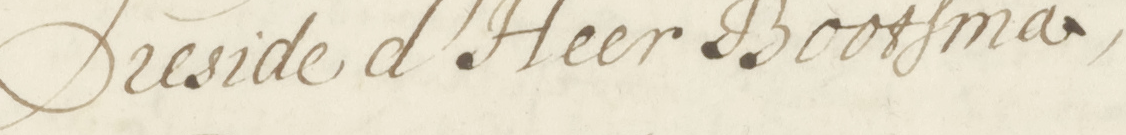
Preside d'Heer Bootsma,
